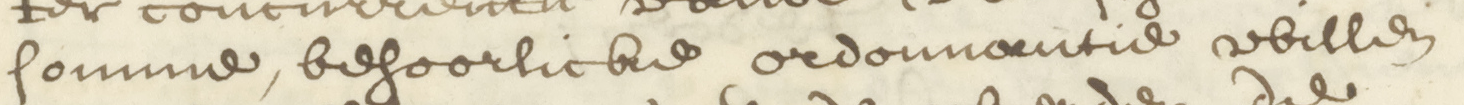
somme, behoorlicke ordonnantie willen
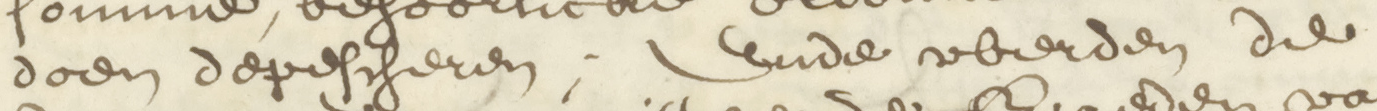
doen depescheren; Ende werden de
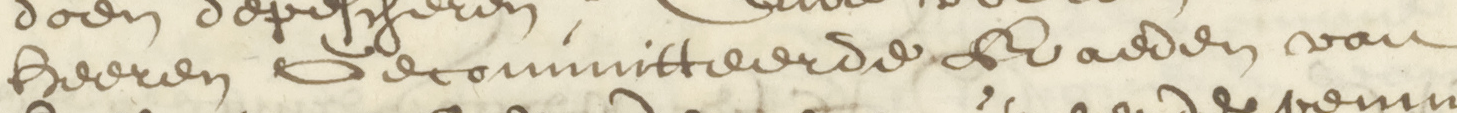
Heeren Gecommitteerde Raeden van
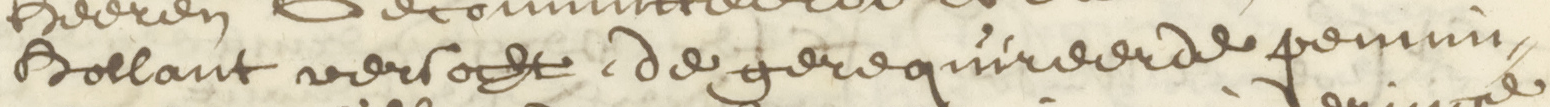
Hollant versocht, de gerequireerde pennin„
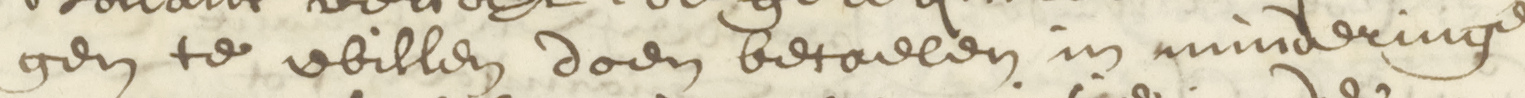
gen te willen doen betaelen in minderinge
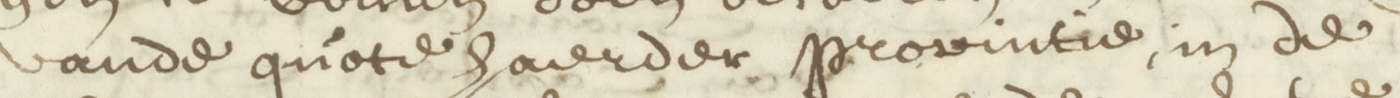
vande quote haerder provintie, in de
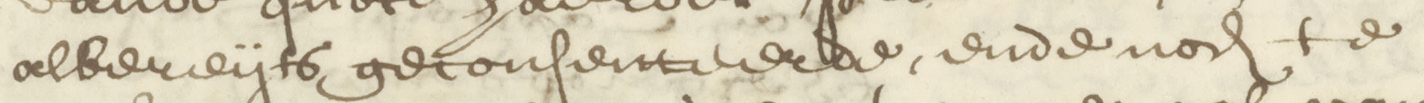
albereijts geconsenteerde, ende noch te
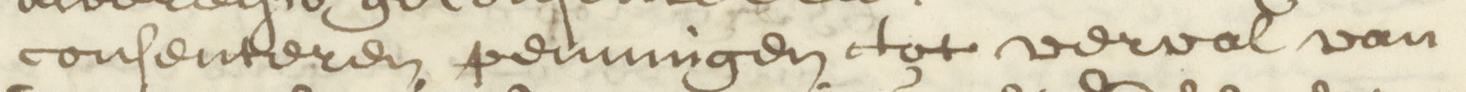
consenteren penningen tot verval van
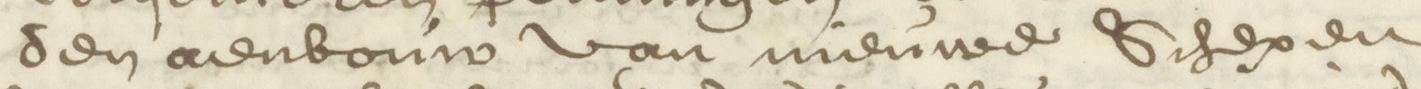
den aenbouw van nieuwe Schepen
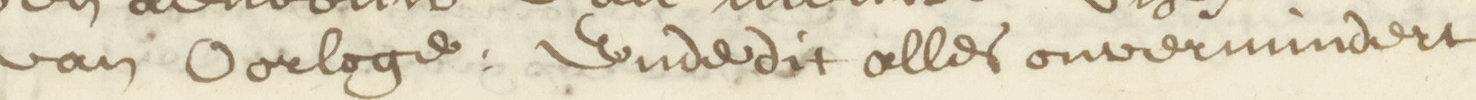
van Oorloge: Ende dit alles onvermindert
